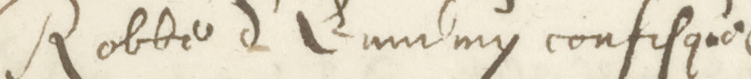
Robbe d' Ennemy confisque
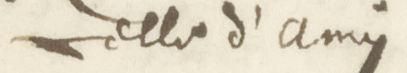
celle d'Amij
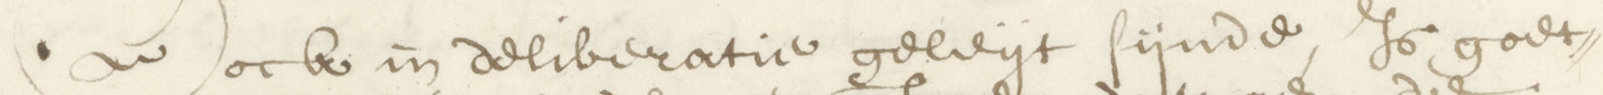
Oock in deliberatie geleijt sijnde, Is goet„
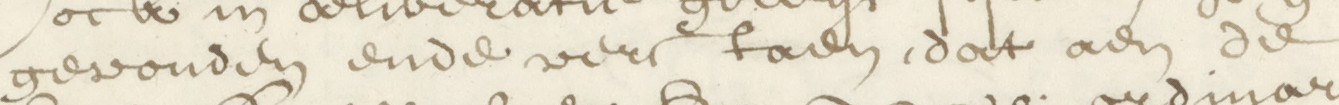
gevonden ende verstaen, dat aen de
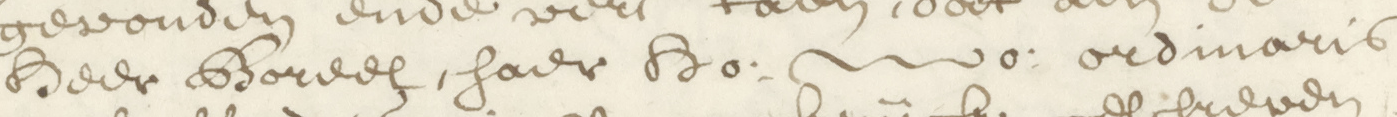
Heer Boreel, haer Ho:Mo: ordinaris
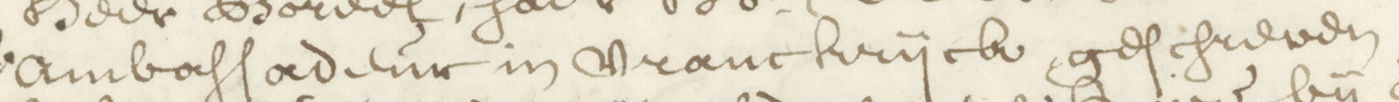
Ambassadeur in Vranckrijck, geschreven
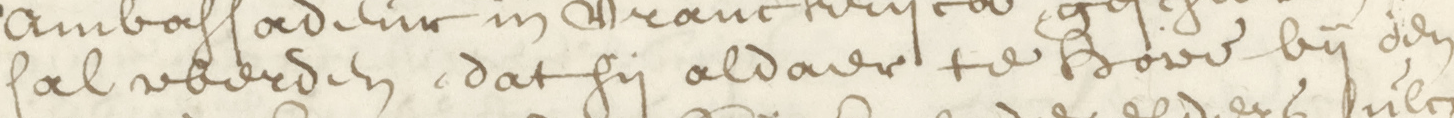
sal werden, dat hij aldaer te Hove bij den
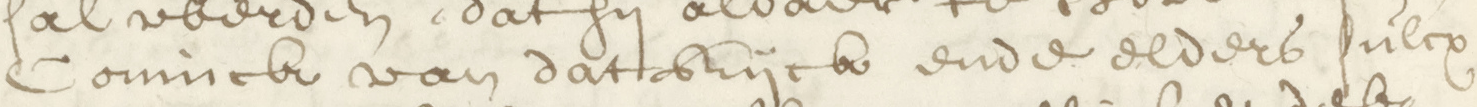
Coninck van dat Rijck ende elders sulcx
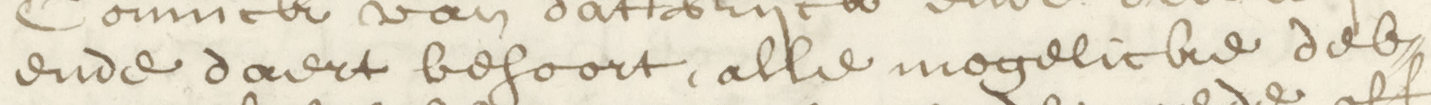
ende daert behoort, alle mogelicke deb„
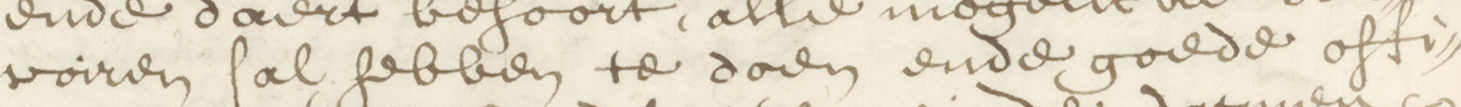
voiren sal hebben te doen ende goede offi„
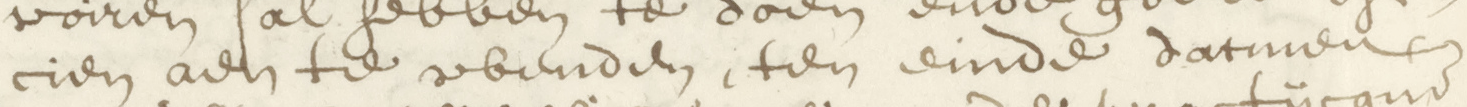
cien aen te wenden, ten einde datmen
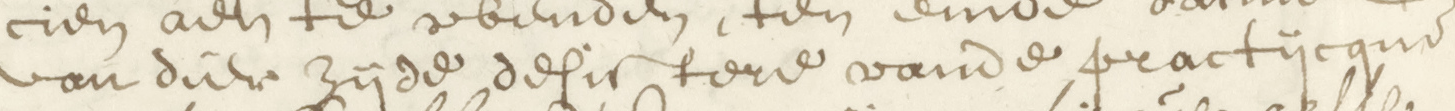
van dier zijde desistere vande practijcque
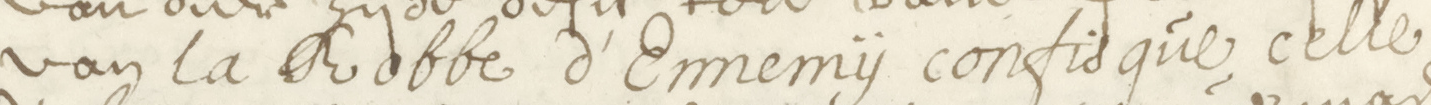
van la Robbe d'Ennemij confisque celle
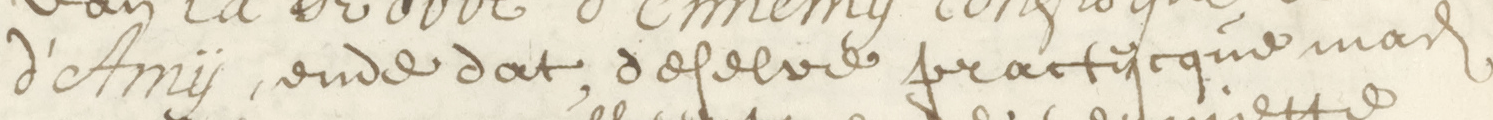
d'Amij, ende dat deselve practijcque mach
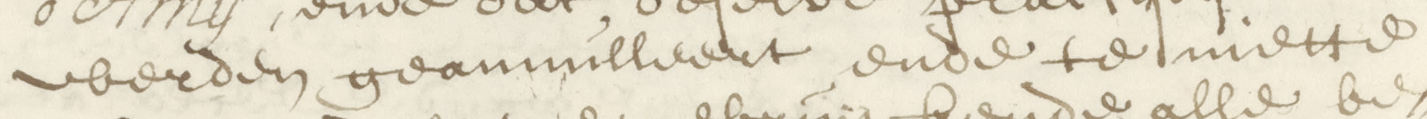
werden geannulleert ende te niette
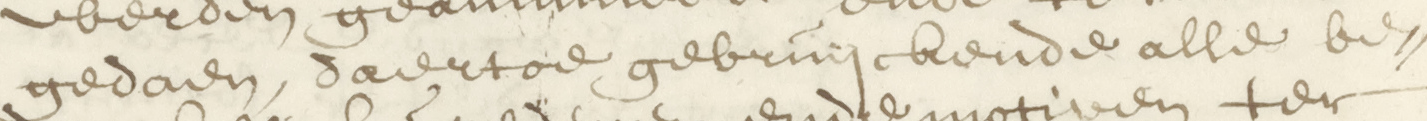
gedaen, daertoe gebruijckende alle be„
